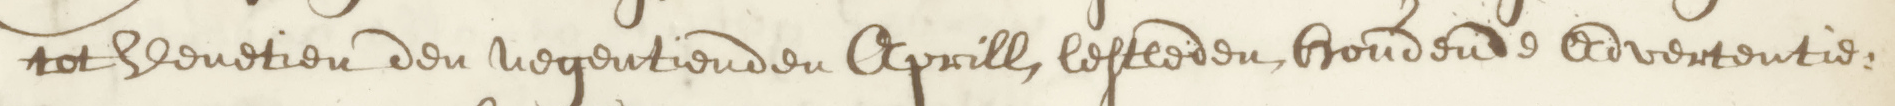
tot Venetien den negentienden Aprill, lestleden, houdende Advertentie:
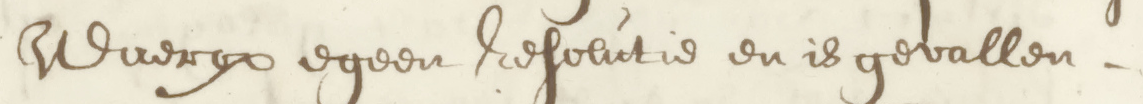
Waerop egeen resolutie en is gevallen. —
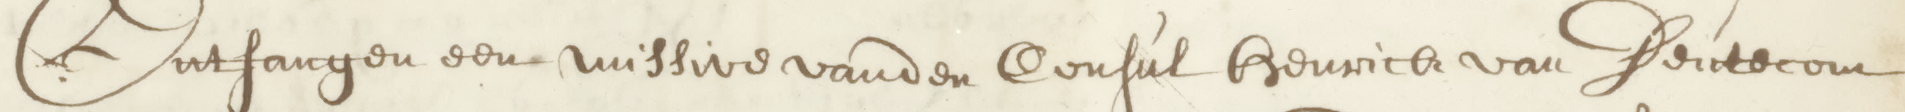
Ontfangen een missive vanden Consul Henrick van Deutecom
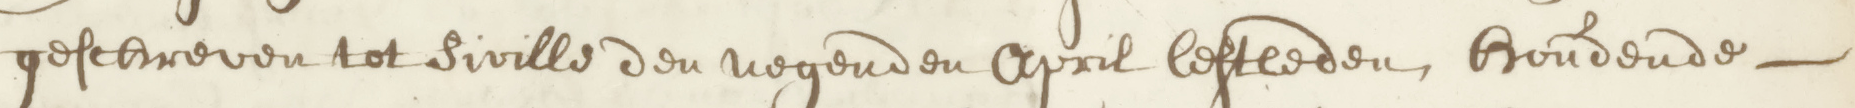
geschreven tot Siville den negenden April lestleden, houdende —
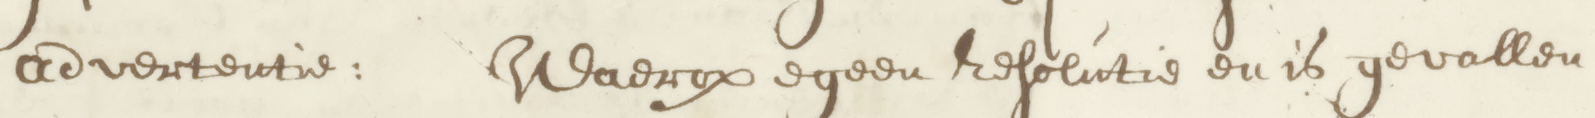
advertentie: Waerop egeen resolutie en is gevallen.
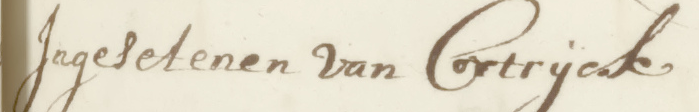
Ingesetenen van Cortrijck
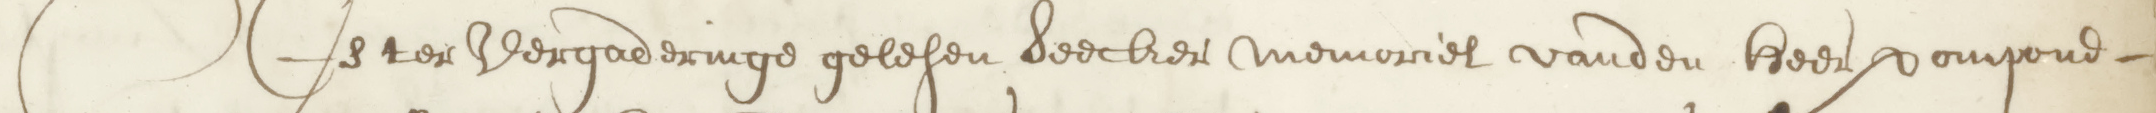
Is ter Vergaderinge gelesen Seecker memoriel vanden heer pompond
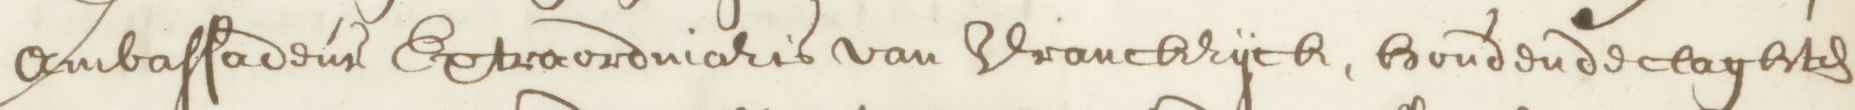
Ambassadeur Extraordinaris van Vranckrijck, houdende claghten
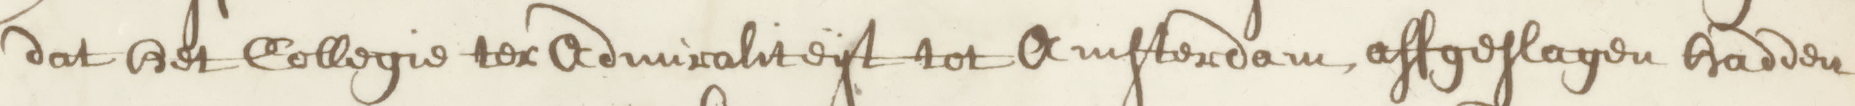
dat het Collegie ter Admiraliteijt tot Amsterdam, affgeslagen hadden
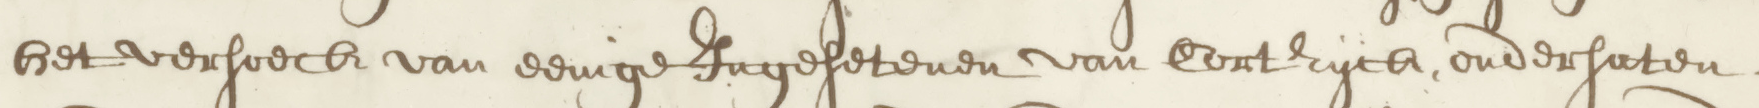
het versoeck van eenige Ingesetenen van Cortrijck, ondersaten
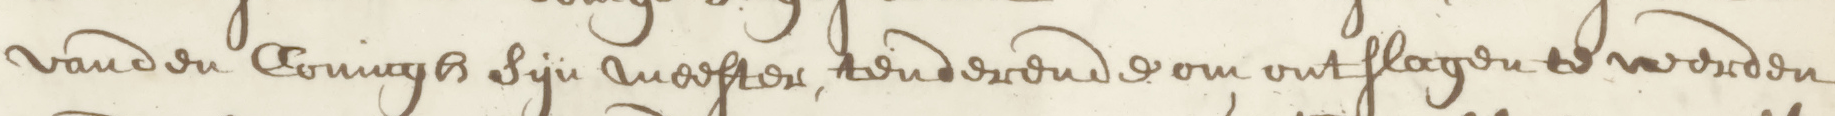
vanden Coningh Sijn meester, tenderende om ontslagen te worden
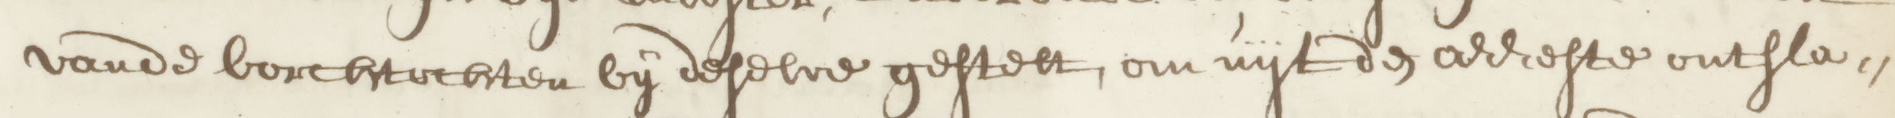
vande borchtochten bij deselve gestelt, om uijt den arreste ontsla„
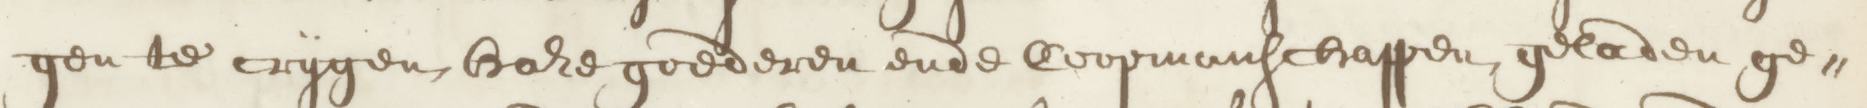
gen te crijgen, hare goederen ende Coopmanschappen, geladen ge„
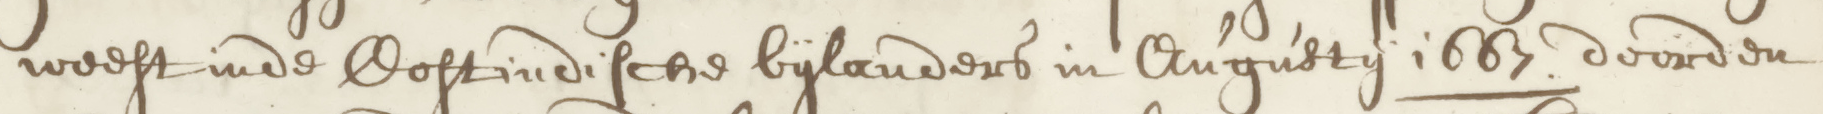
weest inde Oostindische bijlanders in Augustij 1667 doorden
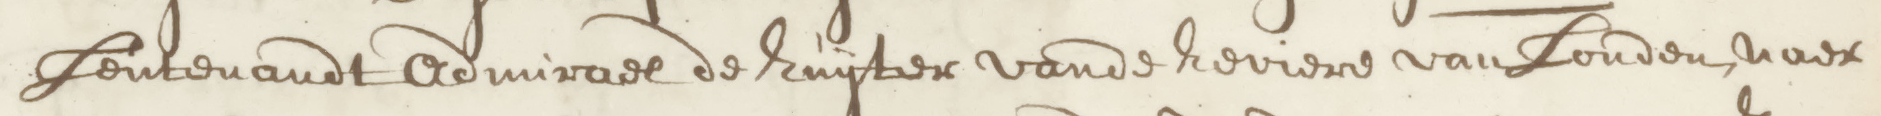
Leutenandt Admirael de Ruijter vande reviere van Londen naer
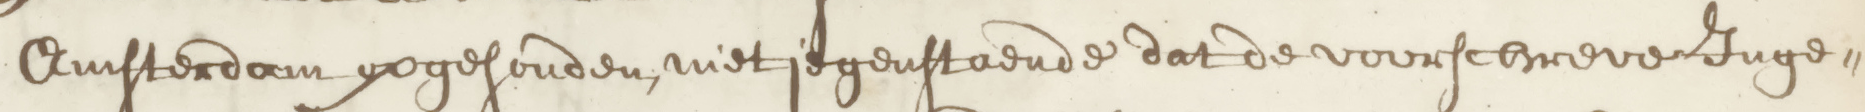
Amsterdam opgesonden, niet jegenstaende dat de voorschreve Inge„
